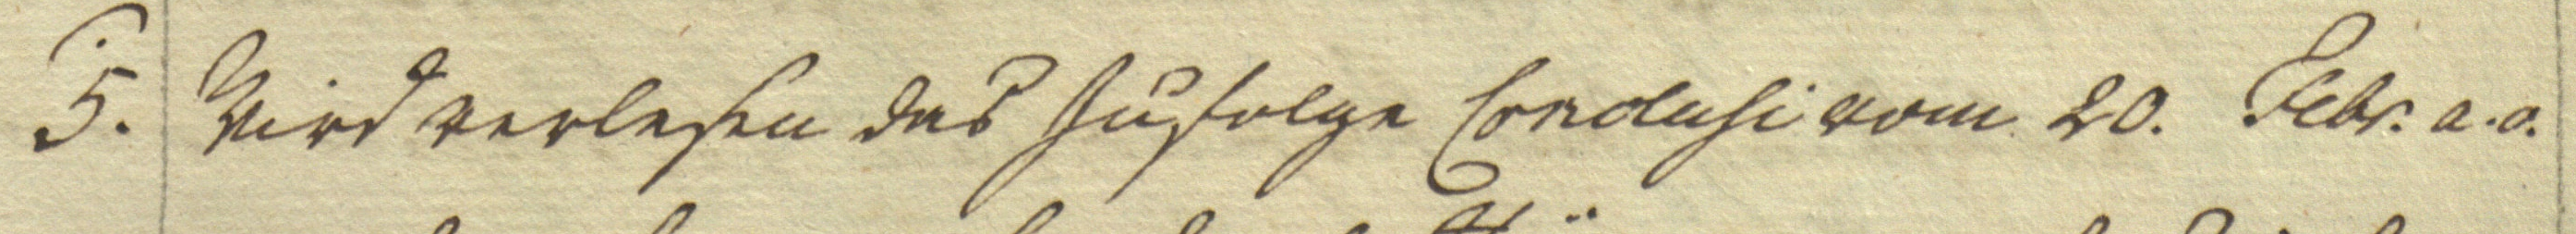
5. Wird verlesen das zufolge Conclusi vom 20. Febr. a. c.
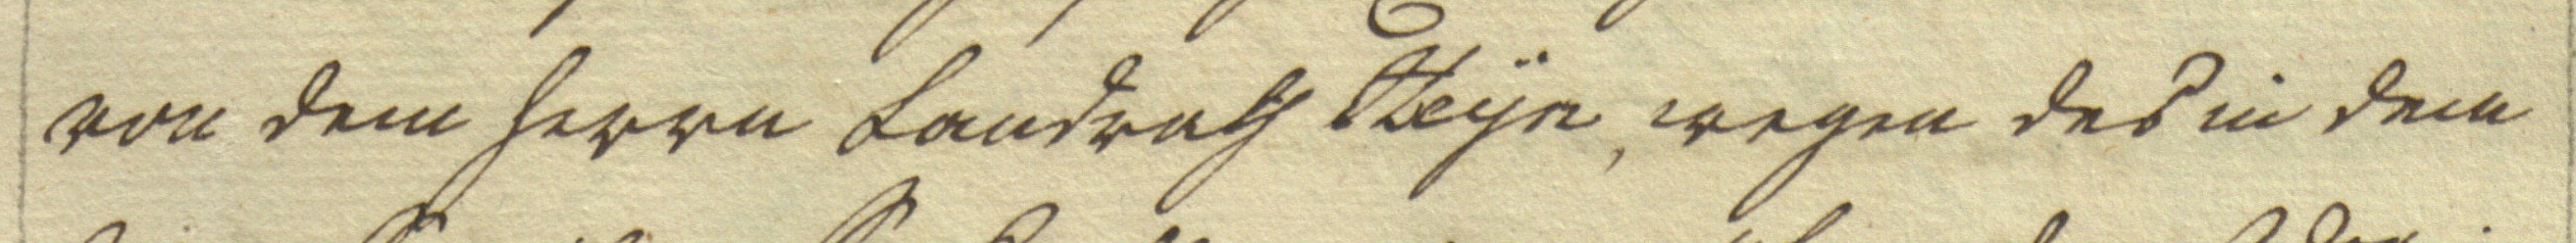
von dem Herrn Landrath Heÿn wegen des in dem
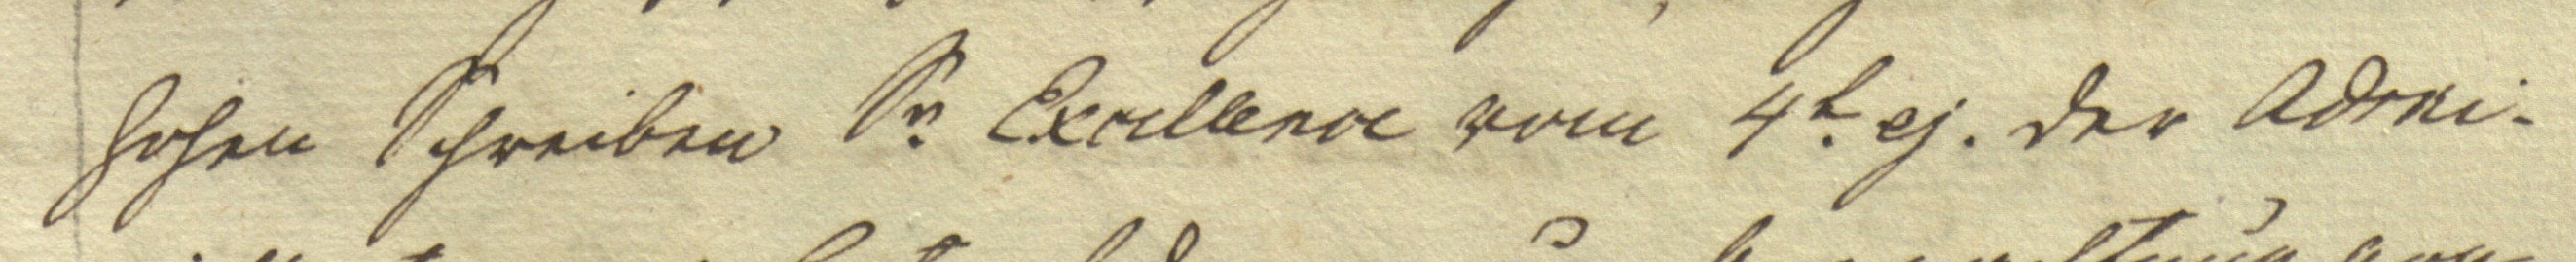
hohen Schreiben Sr Excellence vom 4 t ej. der Admi¬
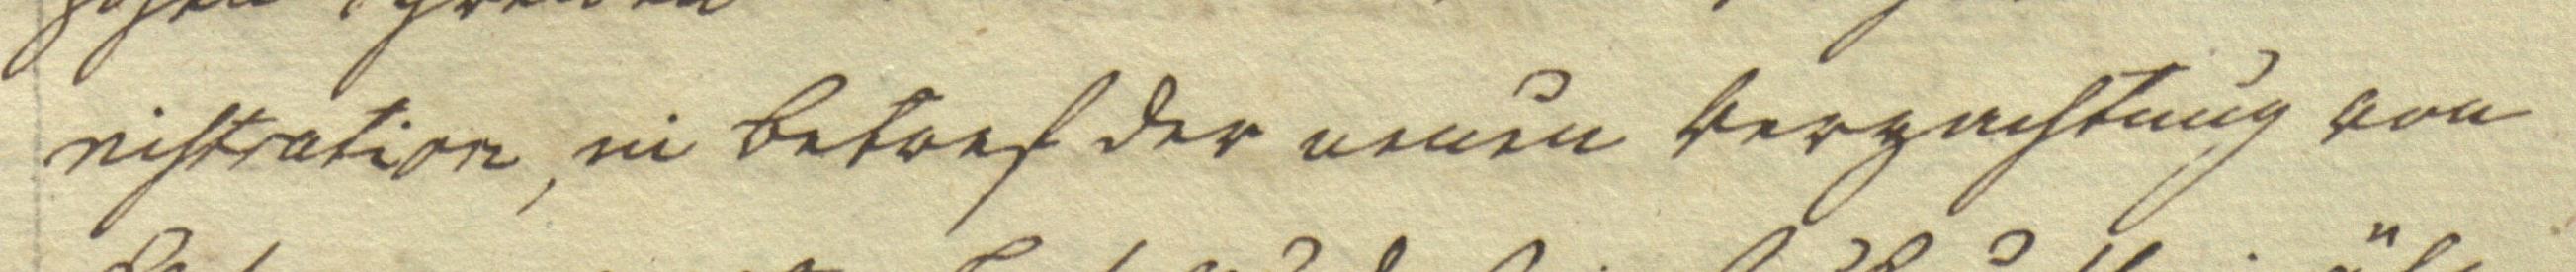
nistration, in Betref der neuen Verpachtung von
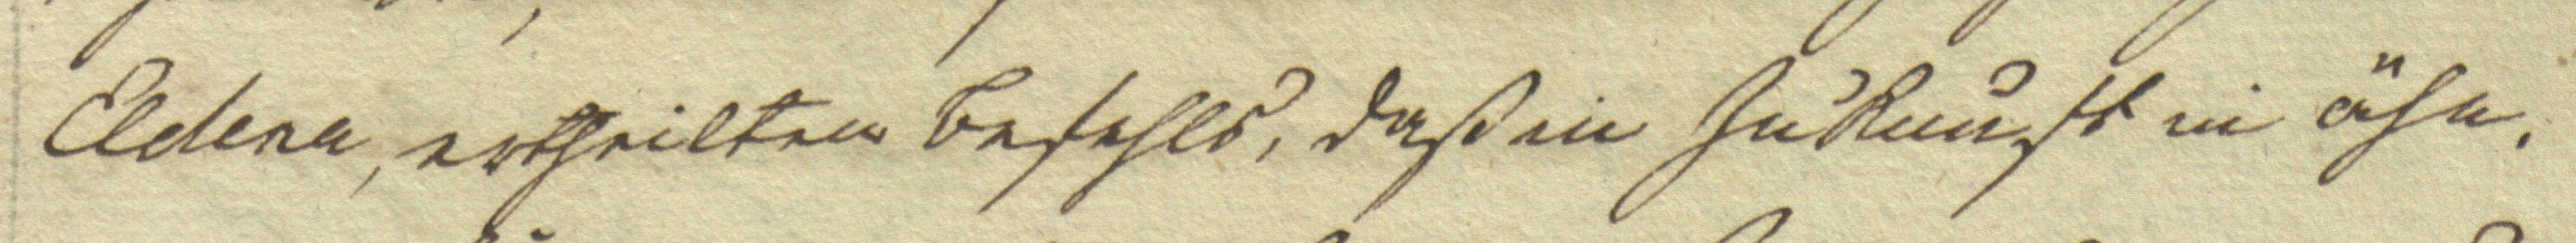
Eldena, ertheilten Befehls, daß in Zukunft in ähn¬
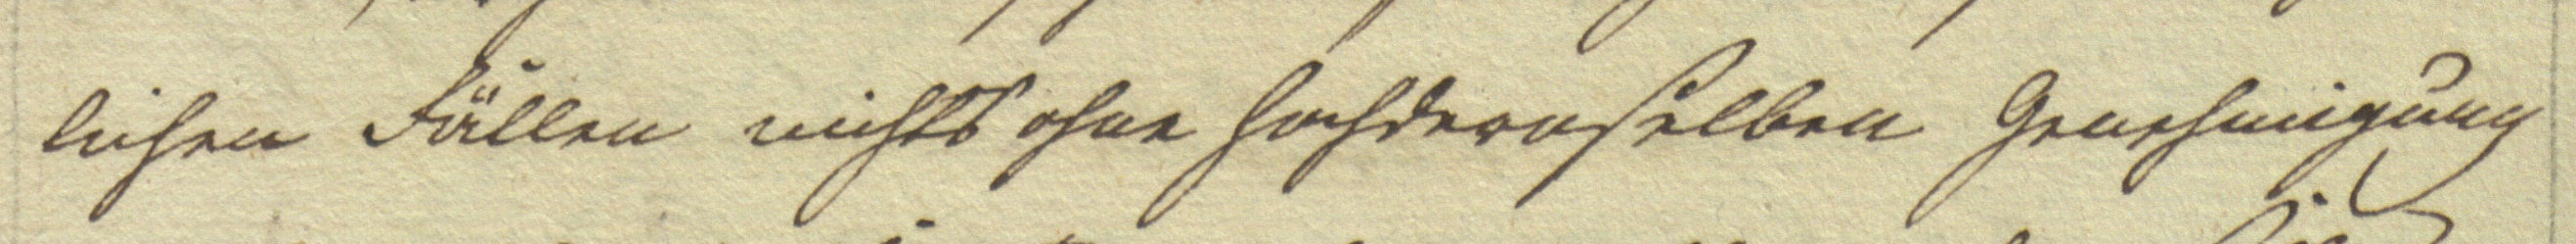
lichen Fällen nichts ohne Hochderoselben Genehmigung
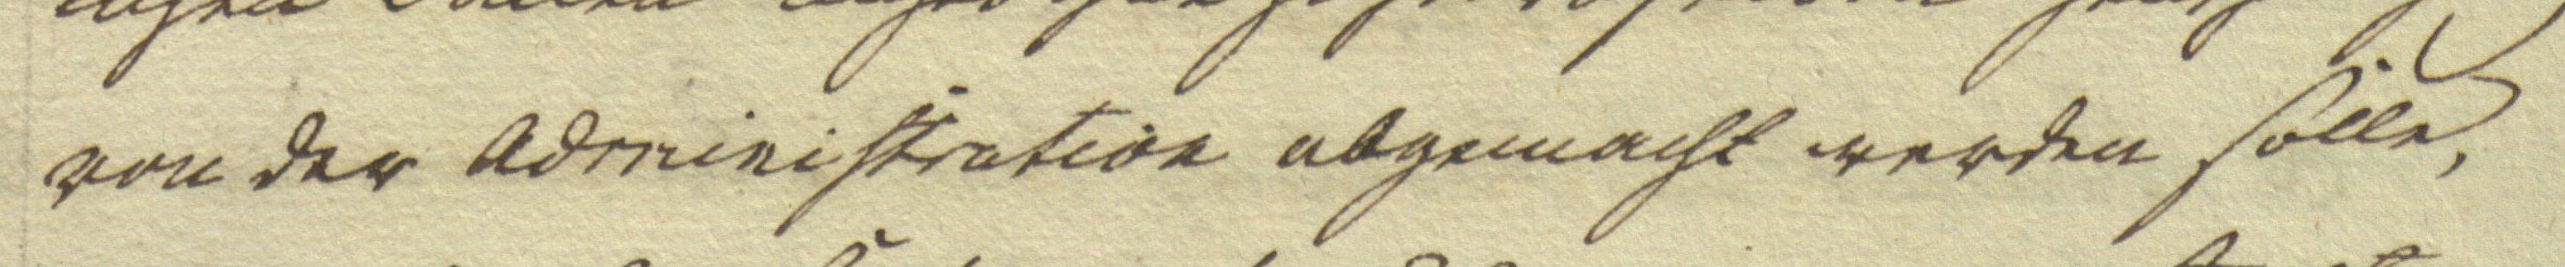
von der Administration abgemacht werden solle,
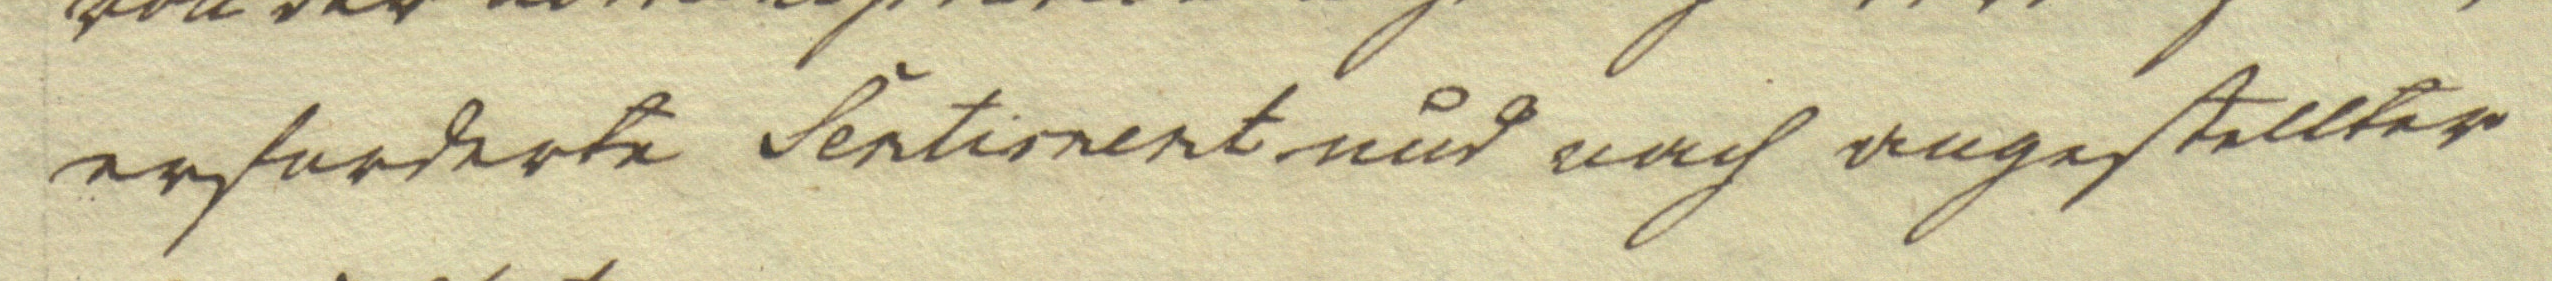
erforderte Sentiment und nach angestellter
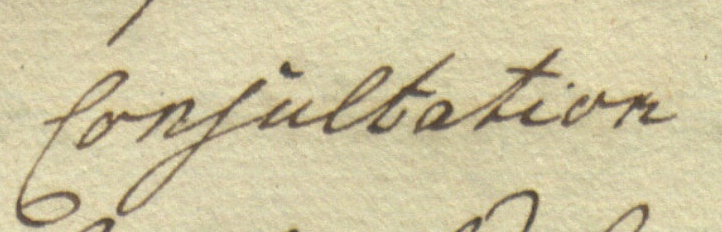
Consultation
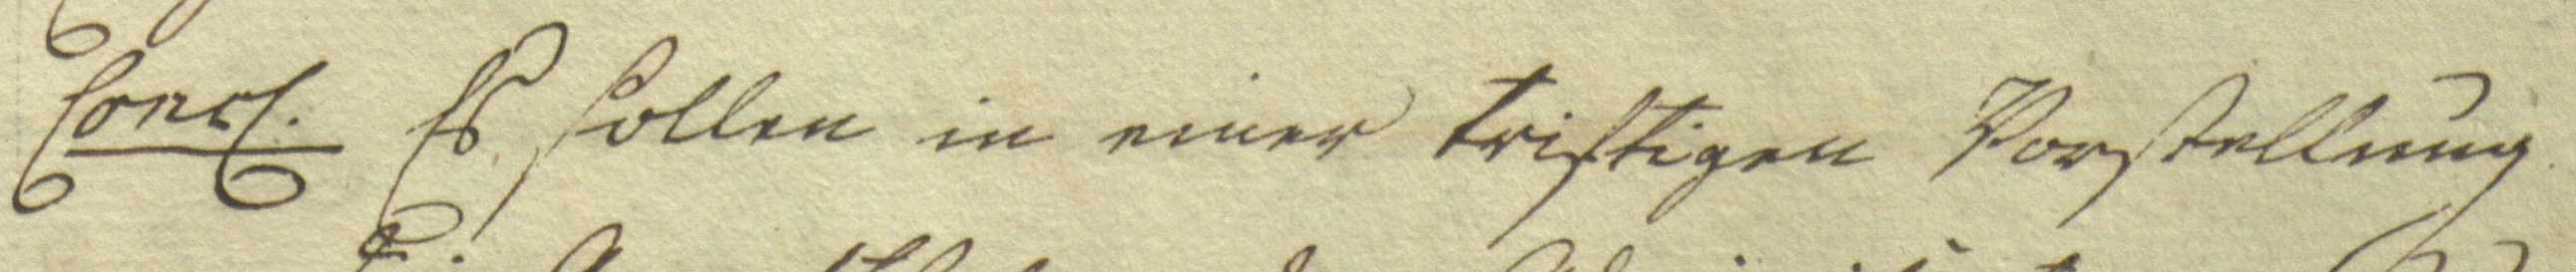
Concl. Es sollen in einer triftigen Vorstellung
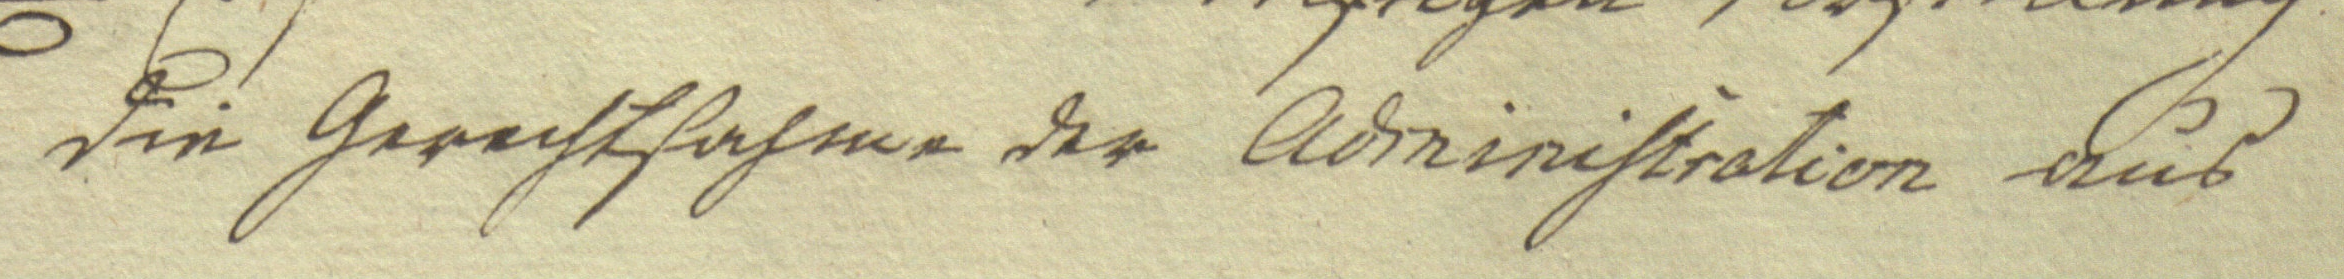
die Gerechtsahme der Administration aus
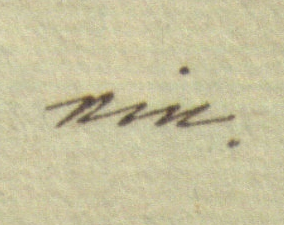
ein
